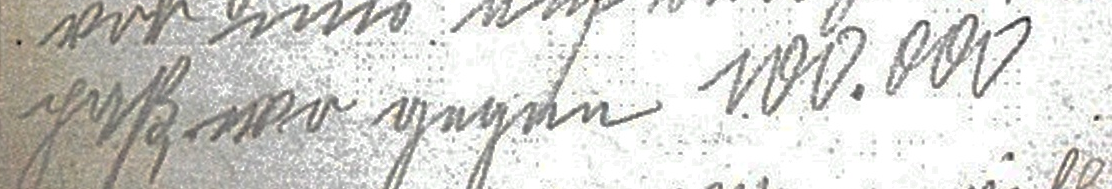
paß, wo gegen 100.000
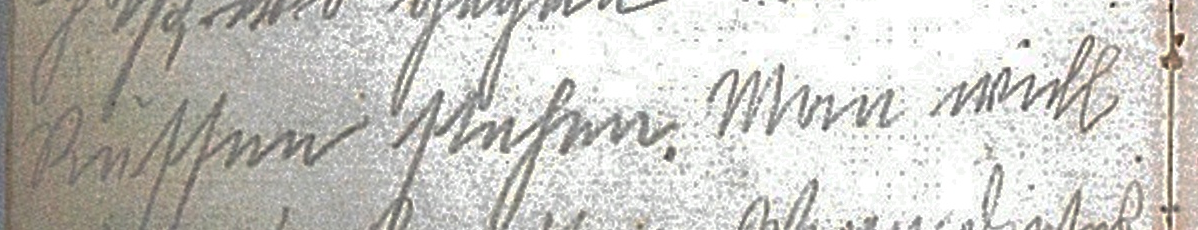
Russen stehen. Man will
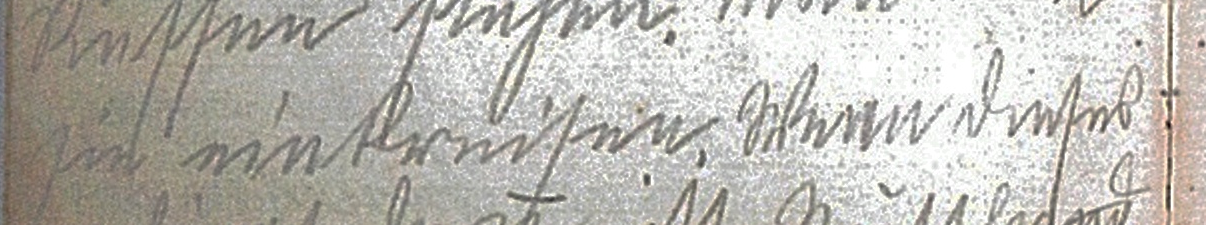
sie einkreisen. Wenn dieses
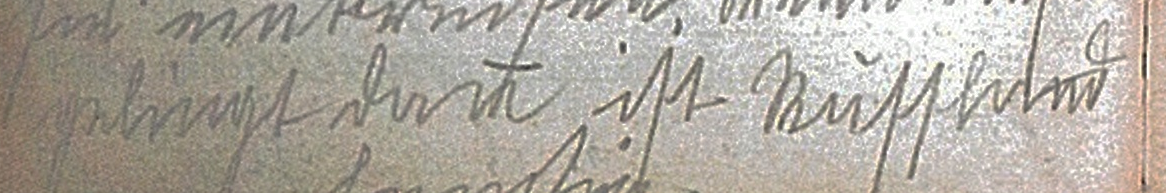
gelingt dann ist Russland
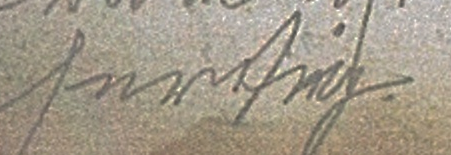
fertig.
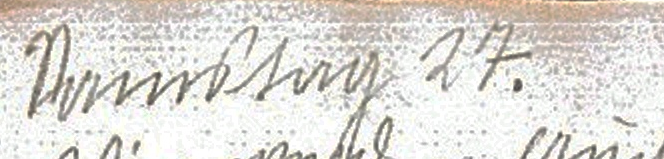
Donenrstag 27.
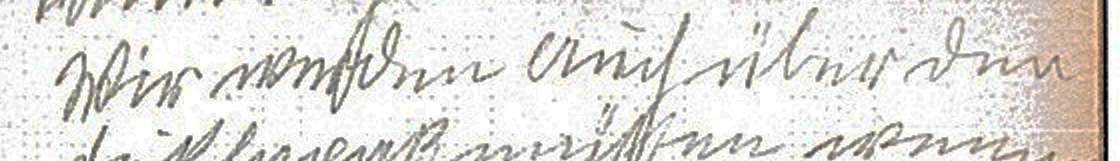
Wir werden auch über den
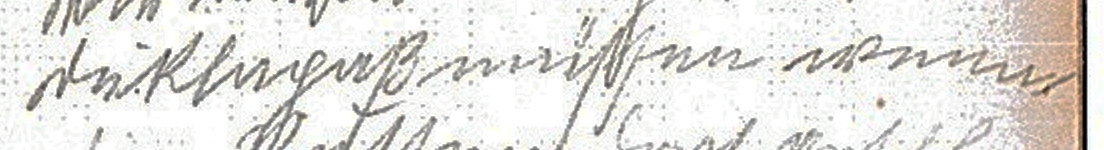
Deklupaß müssen wenn
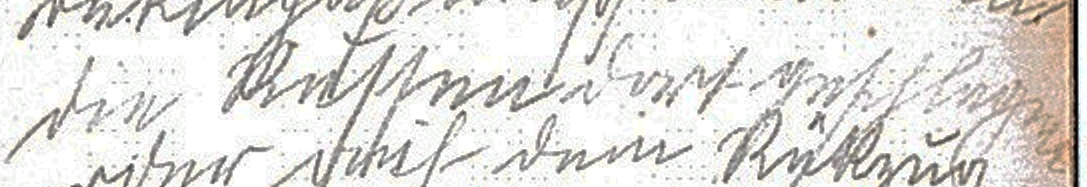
die Russen dort geschlagen
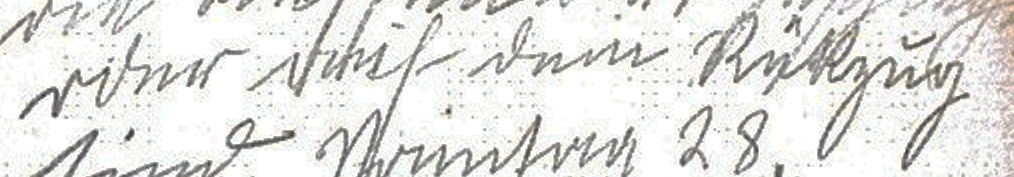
oder auf dem Rückzug
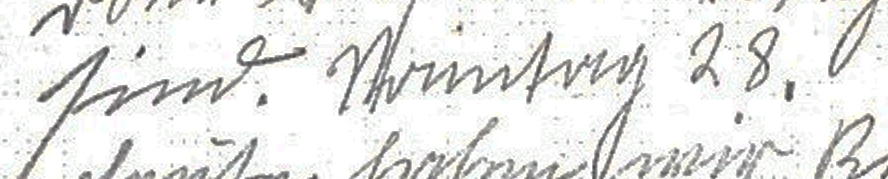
sind. Sonntag 28.
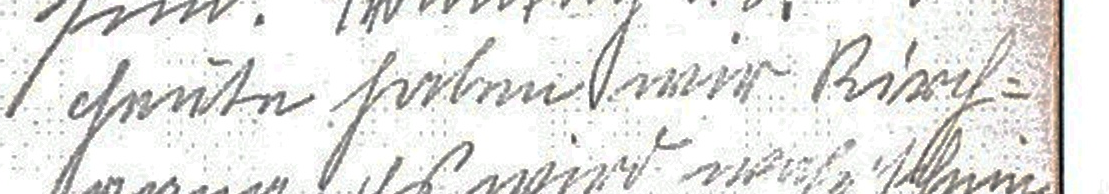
heute haben wir Kirch-
